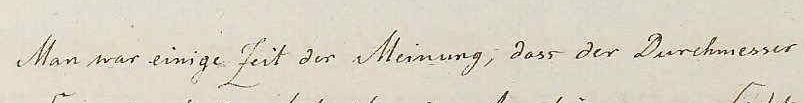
Man war einige Zeit der Meinung, dass der Durchmesser
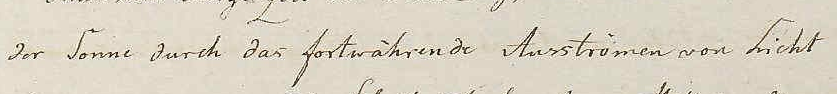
der Sonne durch das fortwährende Ausströmen von Licht
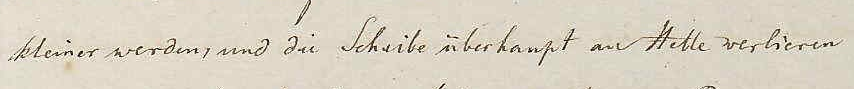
kleiner werden, und die Scheibe überhaupt an Helle verlieren
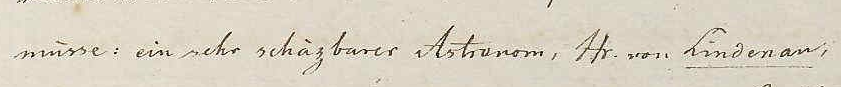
müsse: ein sehr schäzbarer Astronom, Hr. von Lindenau,
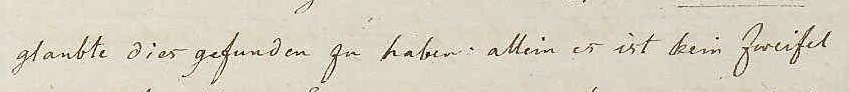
glaubte dies gefunden zu haben: allein es ist kein Zweifel
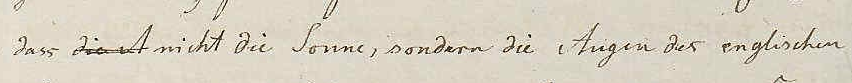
dass die A nicht die Sonne, sondern die Augen des englischen
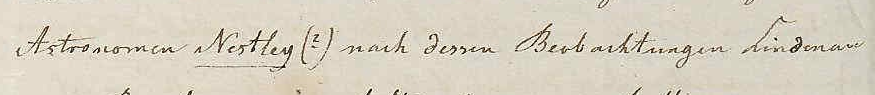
Astronomen Nestley nach dessen Beobachtungen Lindenau
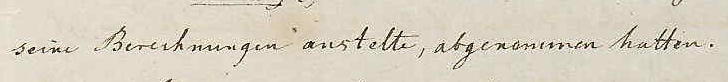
seine Berechnungen anstelte, abgenommen hatten.
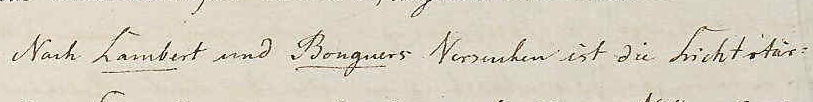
Nach Lambert und Bouguers Versuchen ist die Lichtstär-
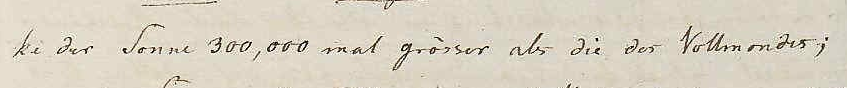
ke der Sonne 300,000 mal grösser als die des Vollmondes;
